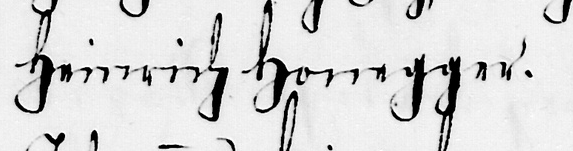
Heinrich Honegger.
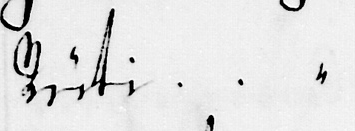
Rüti.
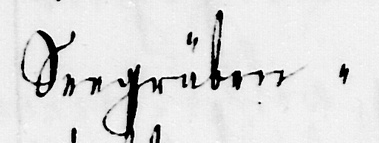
Seegräben
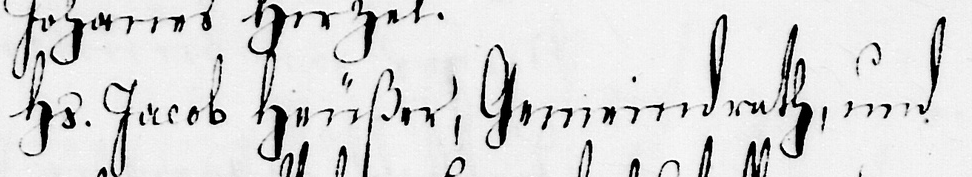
Hs. Jacob Heußer, Gemeindrath, und
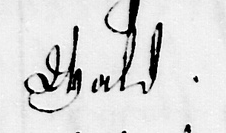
Wald.
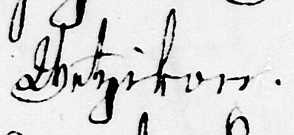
Wetzikon.
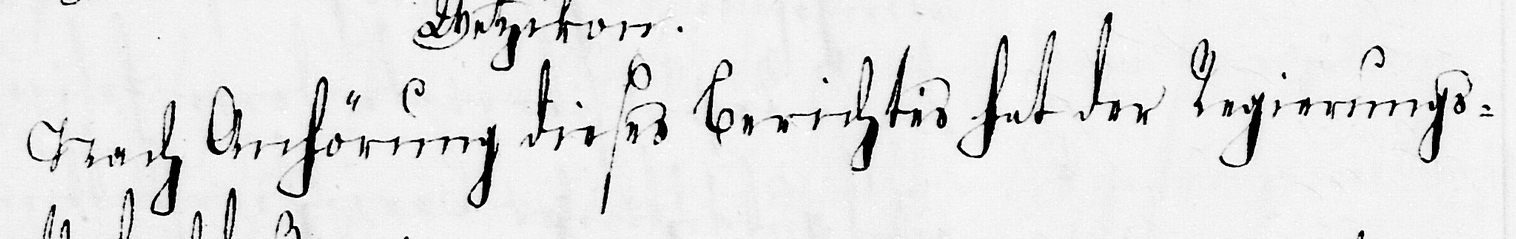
Nach Anhörung dieses Berichtes hat der Regierungs¬
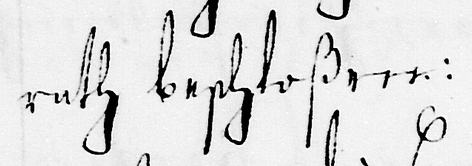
rath beschloßen:
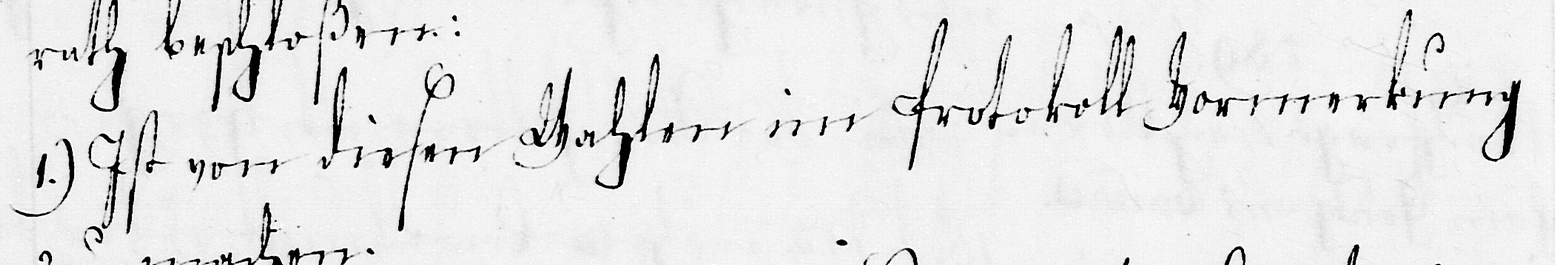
1.) Ist von diesen Wahlen im Protokoll Vormerkung
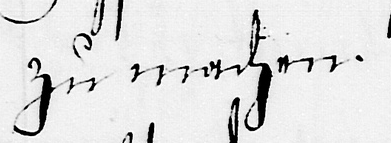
zu machen.
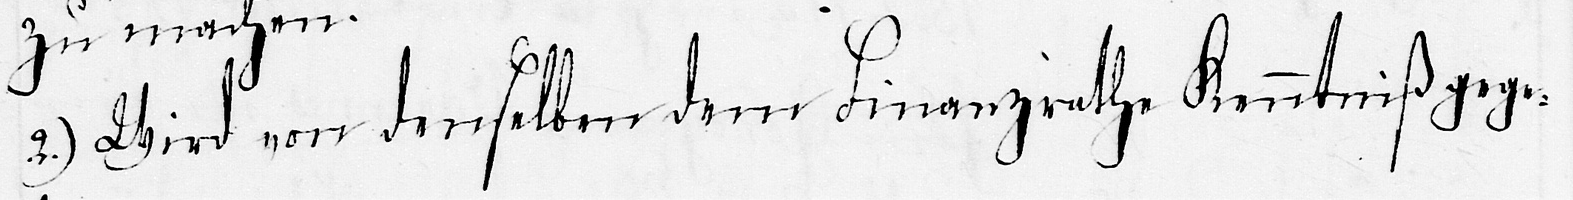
2.) Wird von denselben dem Finanzrathe Kenntniß gege¬
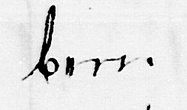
ben.
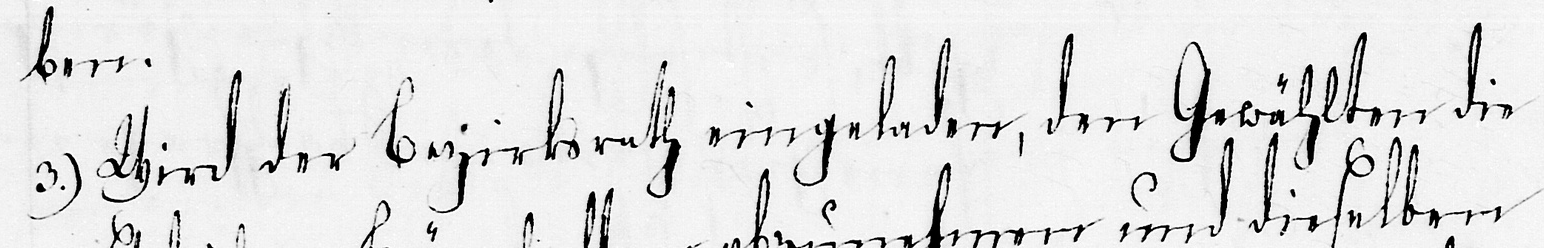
3.) Wird der Bezirksrath eingeladen, den Gewählten die
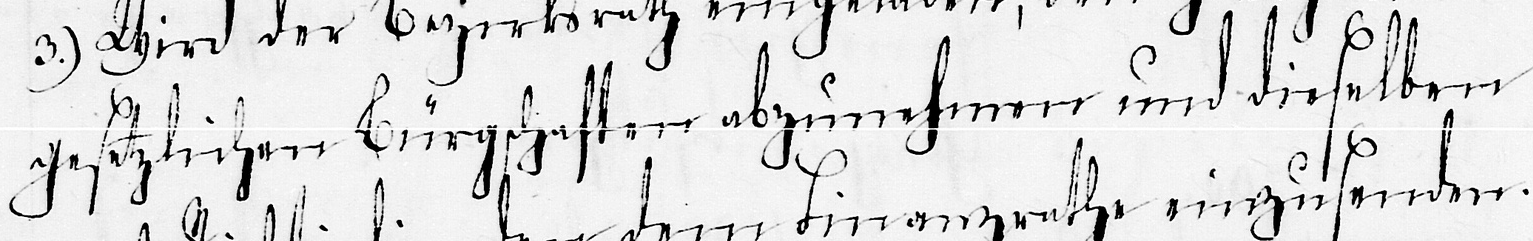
gesetzlichen Bürgschaften abzunehmen und dieselben
